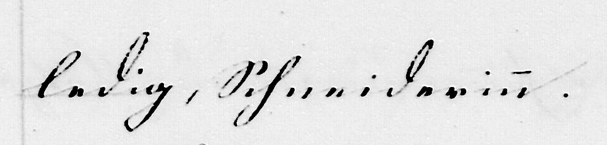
ledig, Schneiderinn.
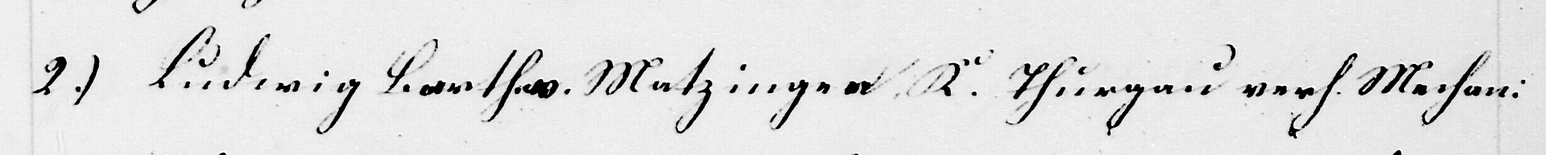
2.) Ludwig Barth [?aus]. Matzingen K. Thurgau verh. Mechan:
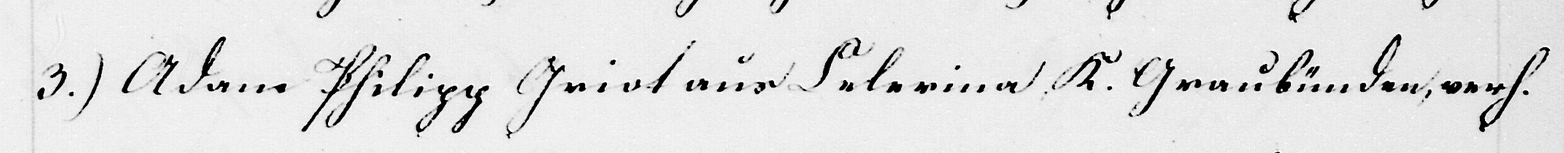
3.) Adam Philipp Griot aus Celerina, K. Graubünden, verh.
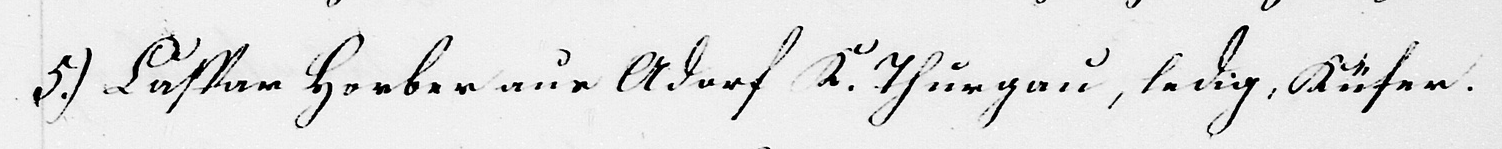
5.) Caspar Horber aus Adorf K. Thurgau, ledig, Küfer.
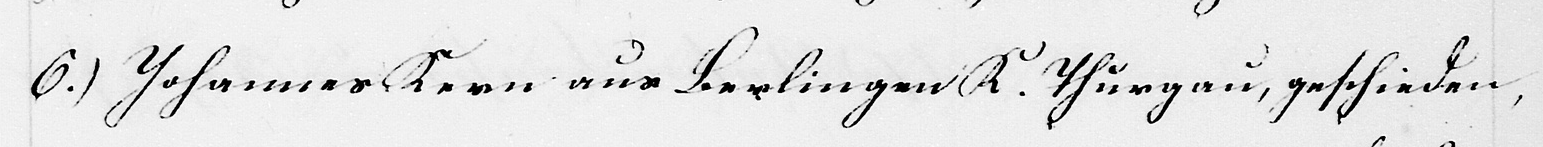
6.) Johannes Kern aus Berlingen K. Thurgau, geschieden,
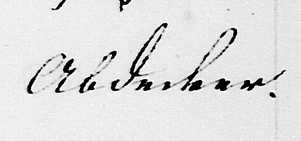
Abdecker.
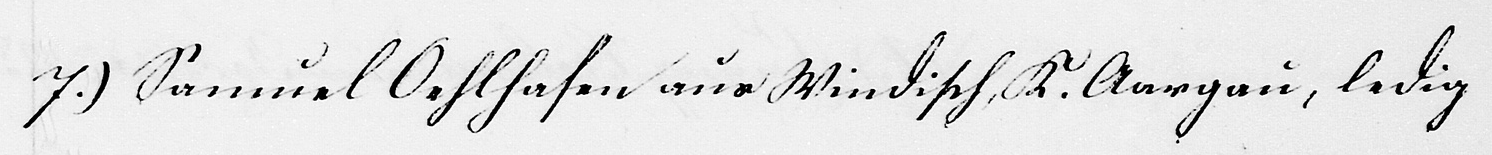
7.) Samuel Oehlhafen aus Windisch, K. Aargau, ledig
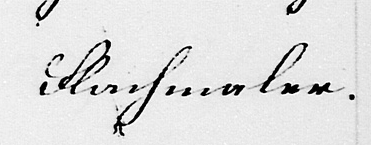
Flachmaler.
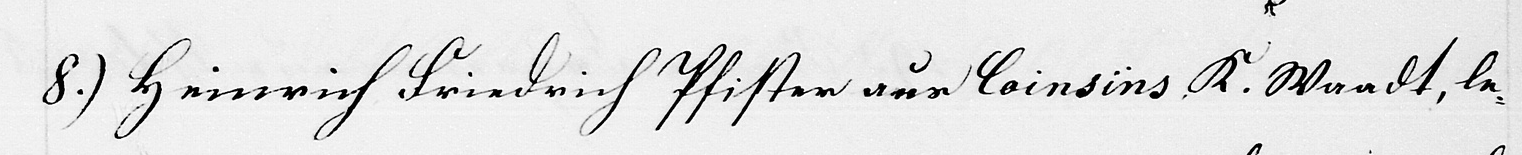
8.) Heinrich Friedrich Pfister aus Coinsins K. Waadt, le¬
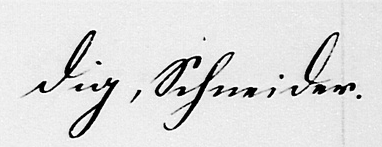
dig, Schneider.
